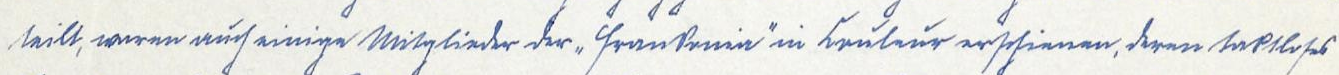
teilt, waren auch einige Mitglieder der „Frankonia“ in Couleur erschienen, deren taktloses
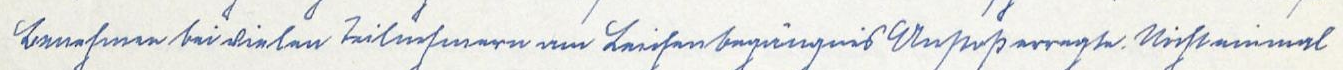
Benehmen bei vielen Teilnehmern am Leichenbegängnis Anstoß erregte. Nicht einmal
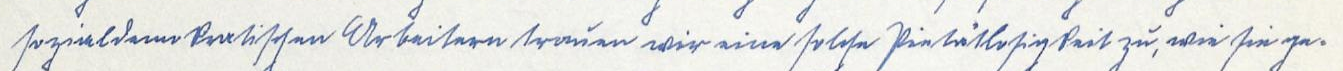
sozialdemokratischen Arbeitern tragen wir eine solche Pietätlosigkeit zu, wie sie ge-
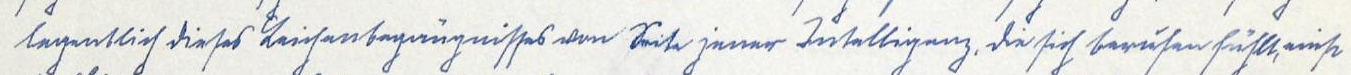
legentlich dieses Leichenbegängnisses von Seite jener Intelligenz, die sich berufen fühlt, einst
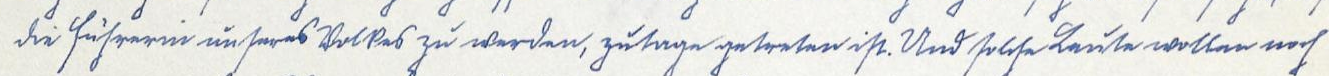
die Führerin unseres Volkes zu werden, zutage getreten ist. Solche Leute wollen noch
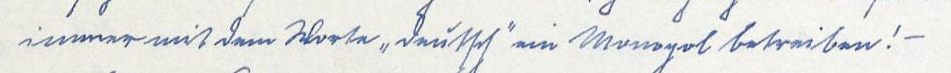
immer mit dem Worte „Deutsch“ ein Monopol betreiben!
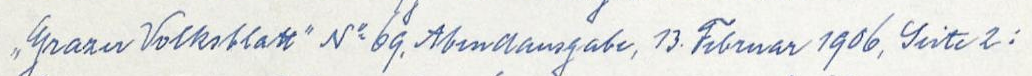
„Grazer Volksblatt“, Nrr 69, Abendausgabe, 13. Februar 1906, Seite 2:
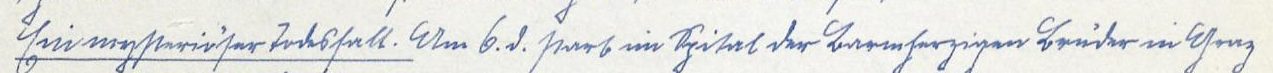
Ein mysteriöser Todesfall. Am 6. d. starb im Spital der Barmherzigen Brüder in Graz
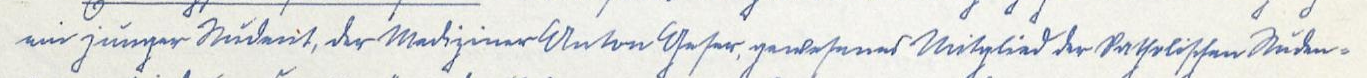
ein junger Student, der Mediziner Anton Geser, gewesenes Mitglied der katholischen Studen-
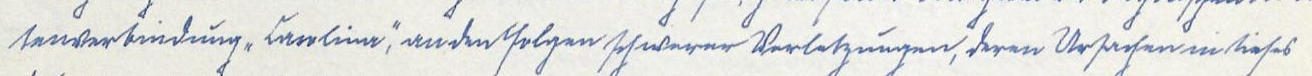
tenverbindung „Carolina“, an den Folgen schwerer Verletzungen, deren Ursachen in tiefes
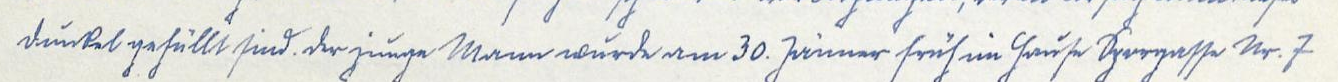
Dunkel gehüllt sind. Der junge Mann wurde am 30. Jänner früh im Hause Sporgasse Nr. 7
